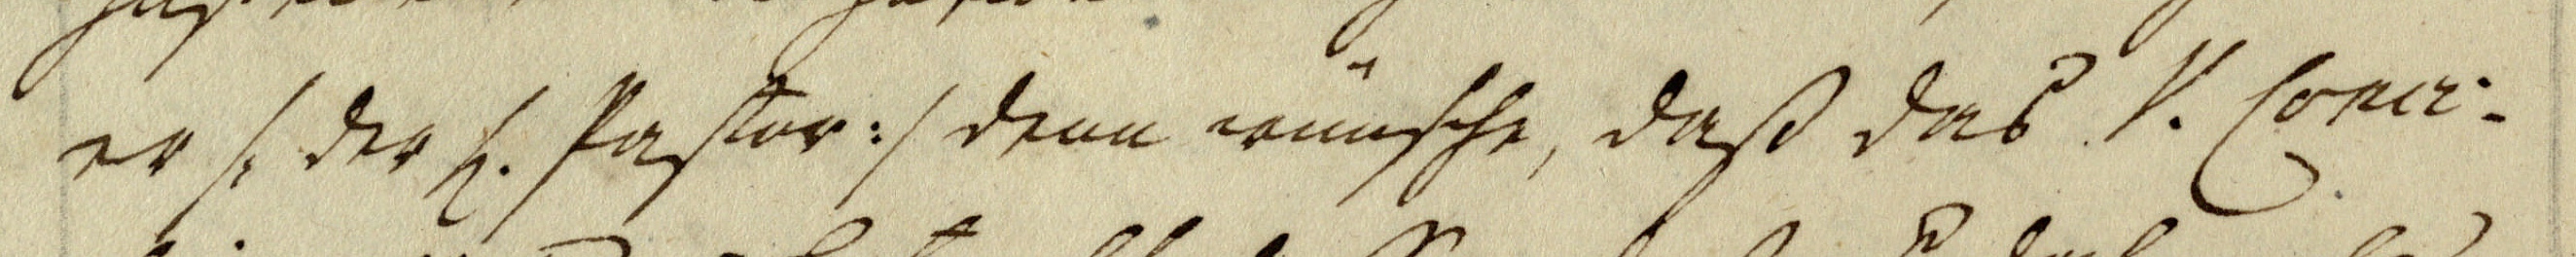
er /: der h. Pastor :/ denn wünsche, daß das V. Conci
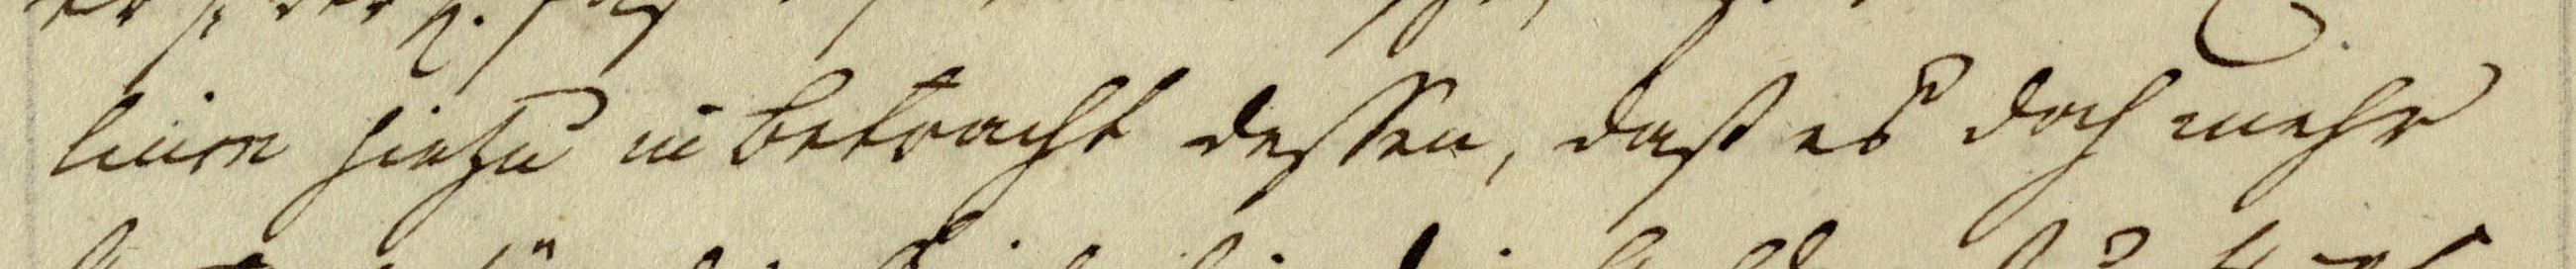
lium hiezu in Betracht dessen, daß es doch mehr
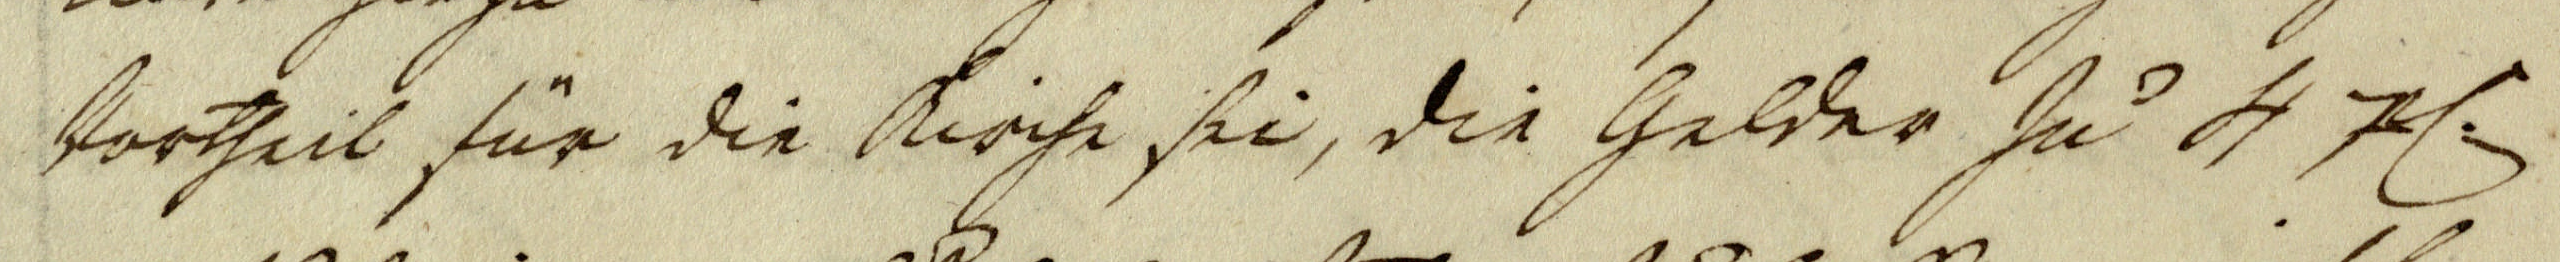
Vortheil für die Kirche sei, die Gelder zu 4 pl.
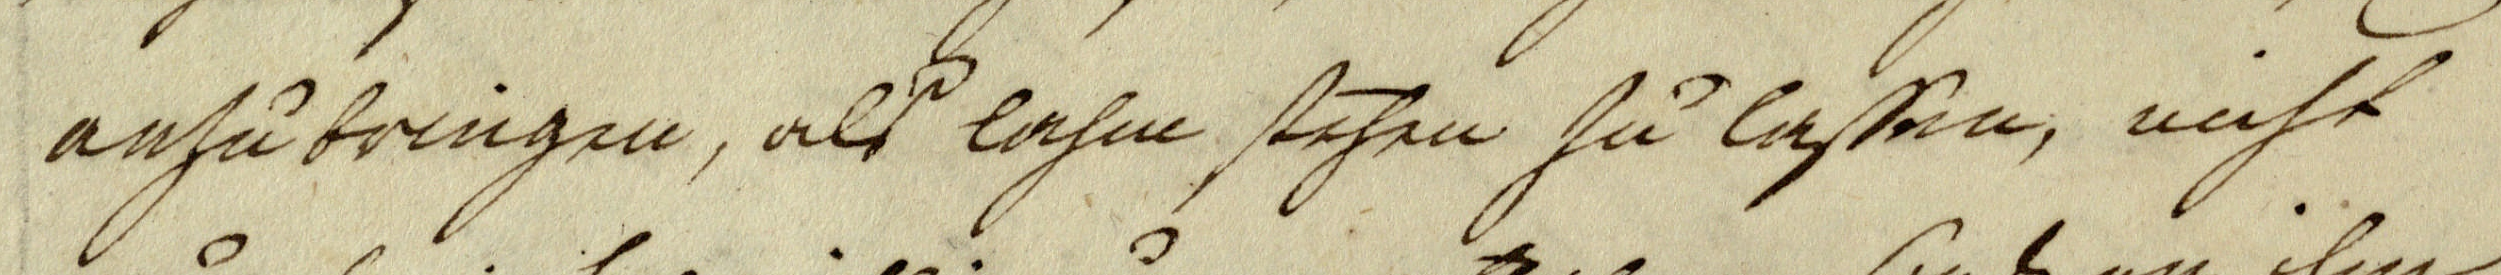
anzubringen, als lahm stehen zu lassen, nicht
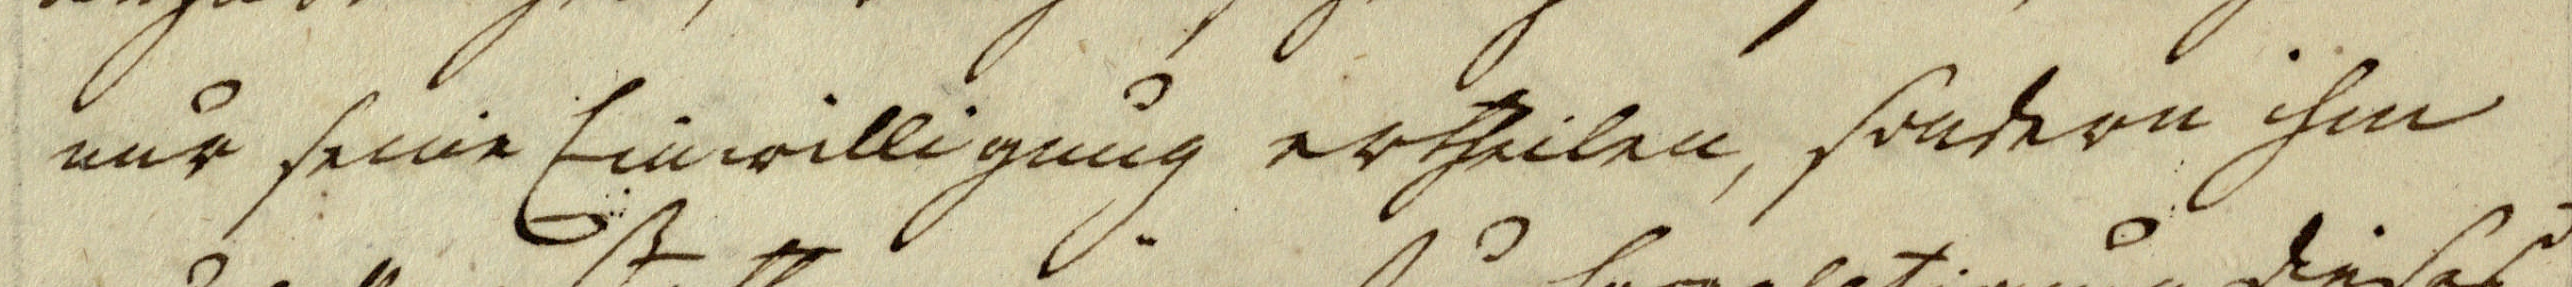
nur seine Einwilligung ertheilen, sondern ihm
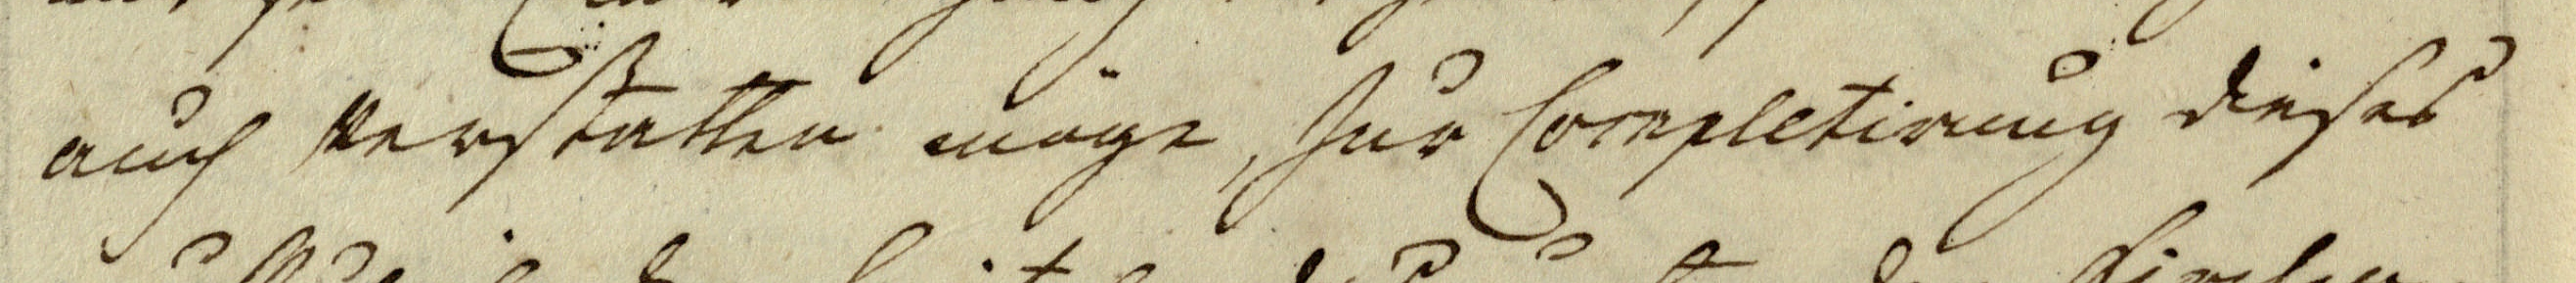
auch verstatten möge, zur Completirung dieses
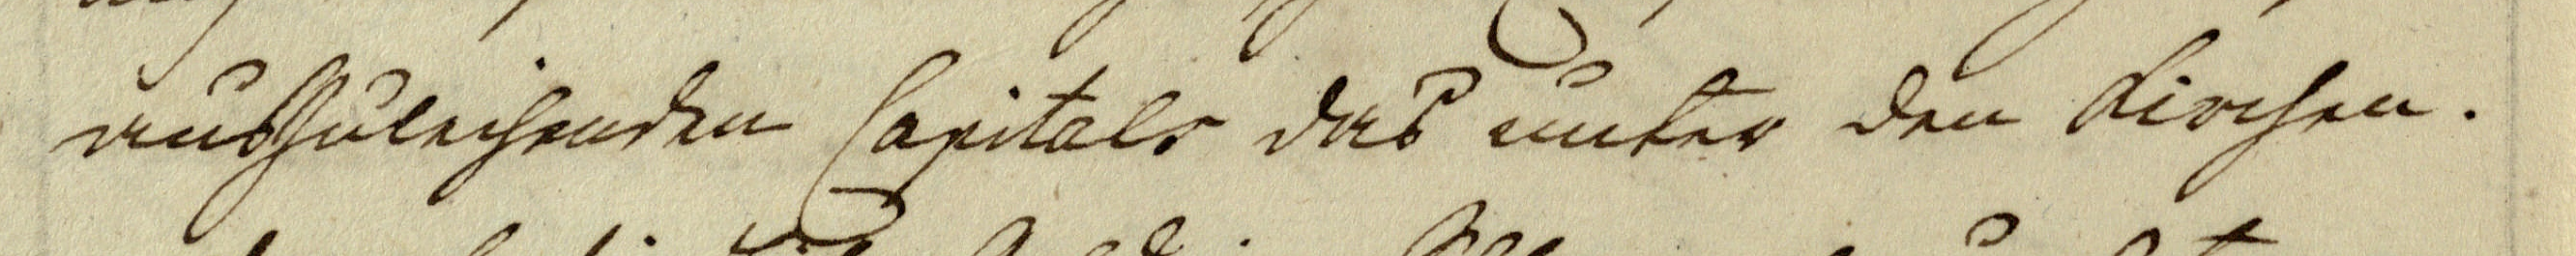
auszuleihenden Capitals das unter den Kirchen¬
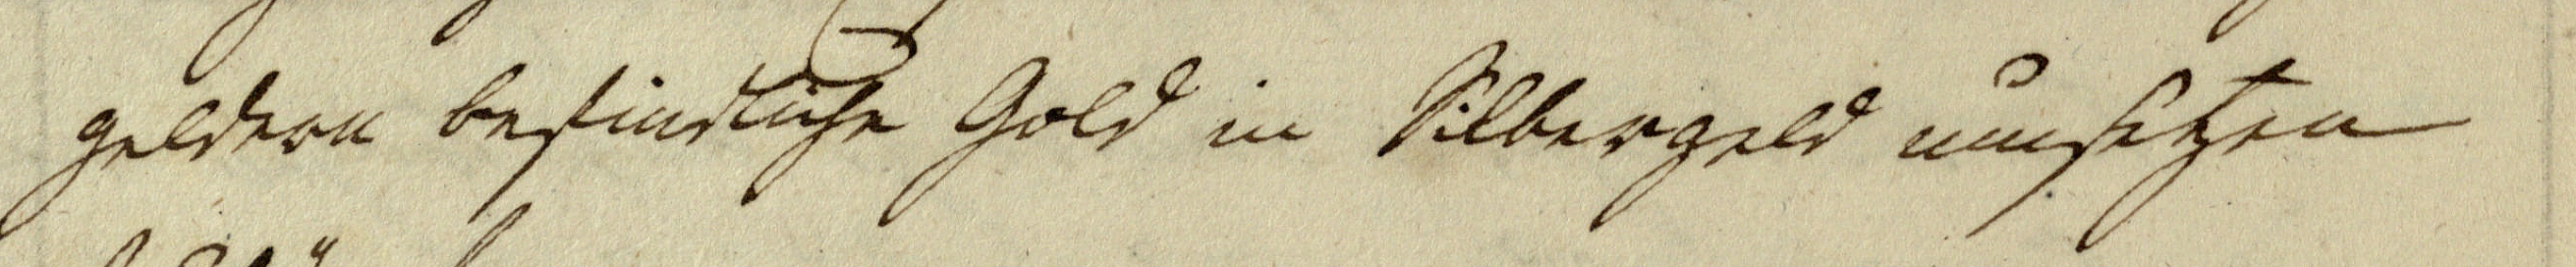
geldern befindliche Gold in Silbergeld umsetzen
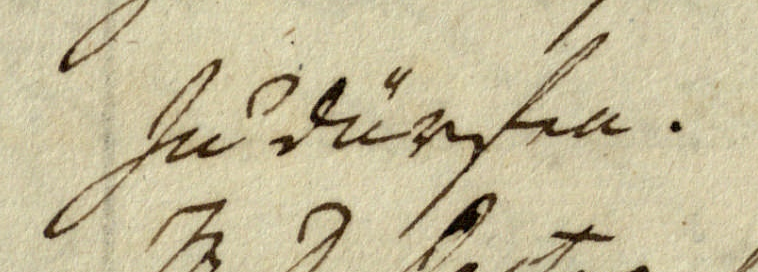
zu dürfen.
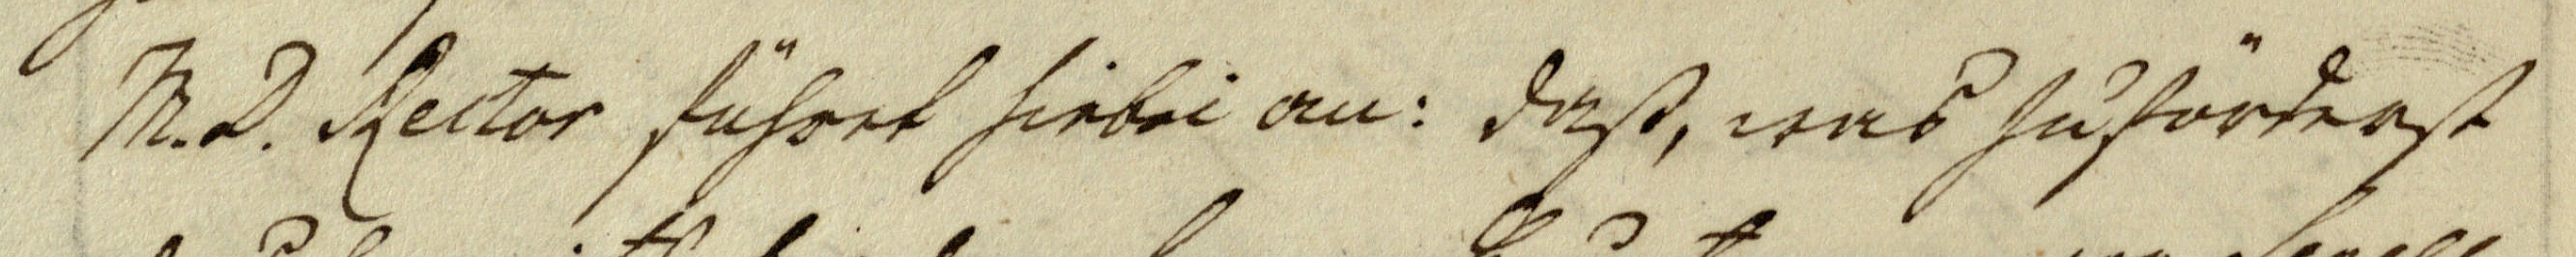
M. D. Rector führet hiebei an: daß, was zuförderst
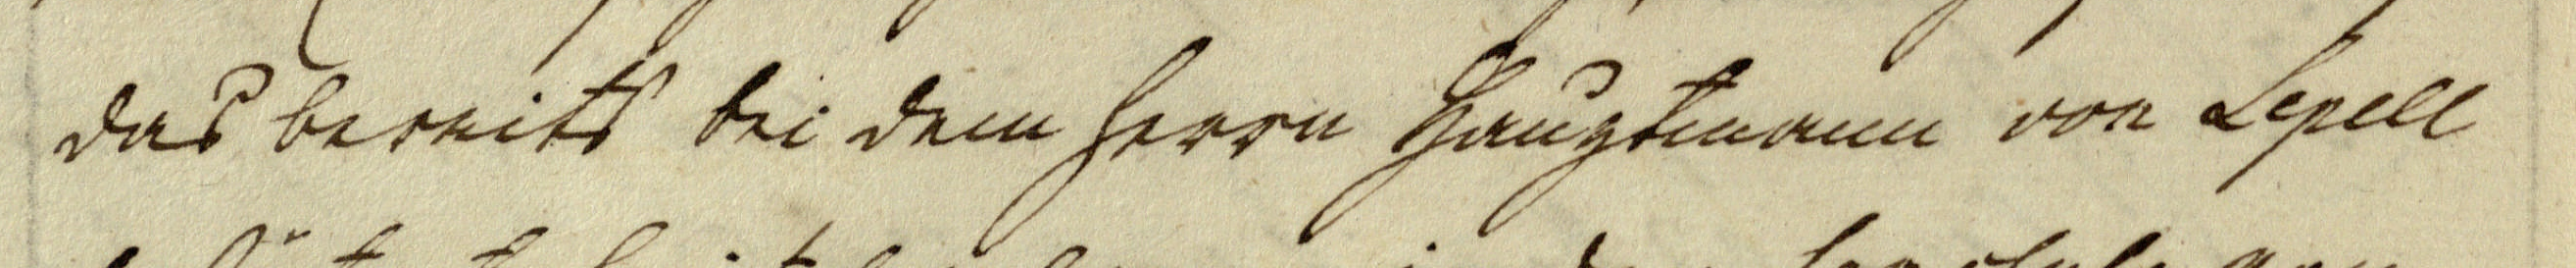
das bereits bei dem Herrn Hauptmann von Lepell
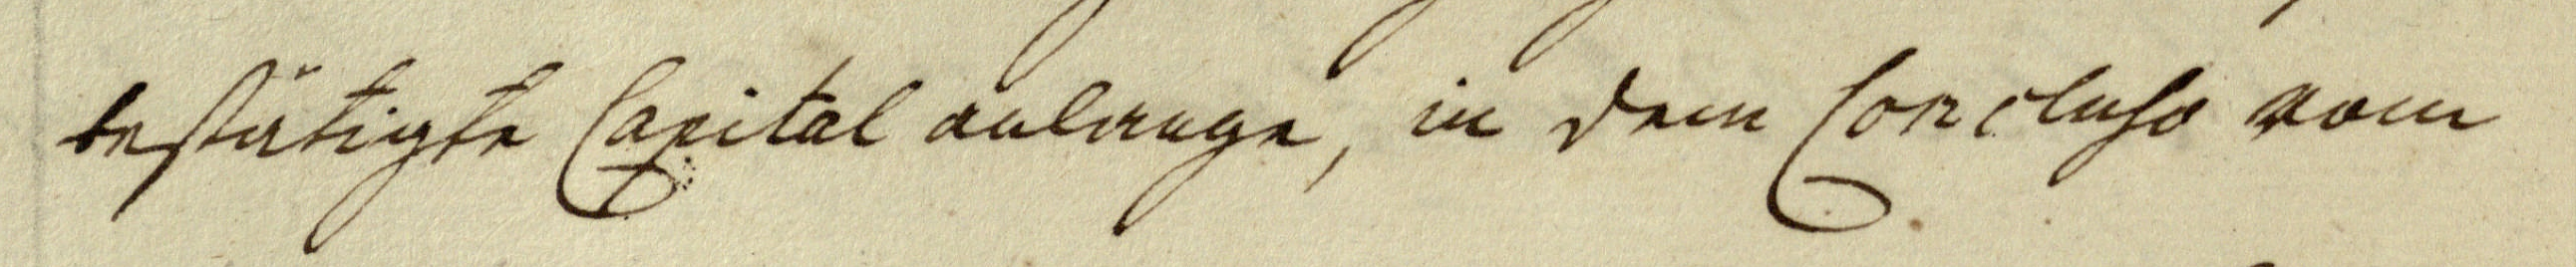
bestätigte Capital anlange, in dem Concluso vom
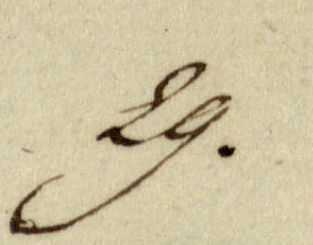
29.
